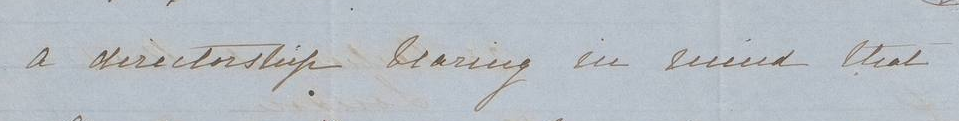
a directorship bearing in mind that
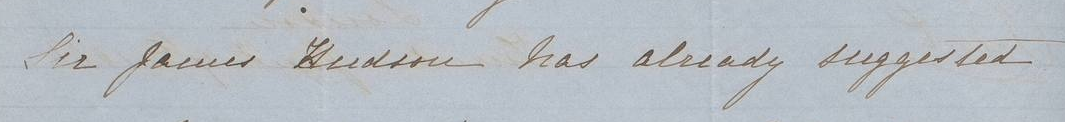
Sir James Hudson has already suggested
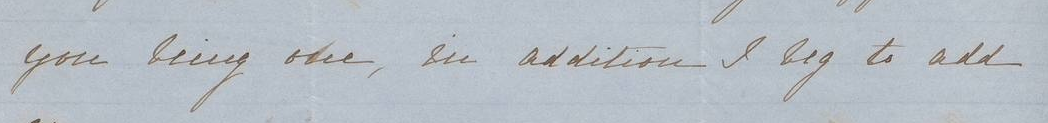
you being one, in addition I beg to add
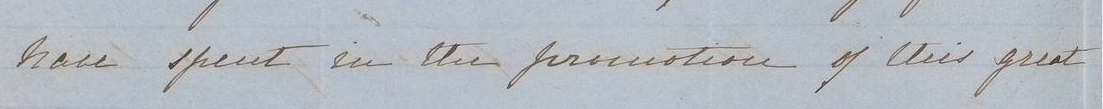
have spent in the promotion of this great
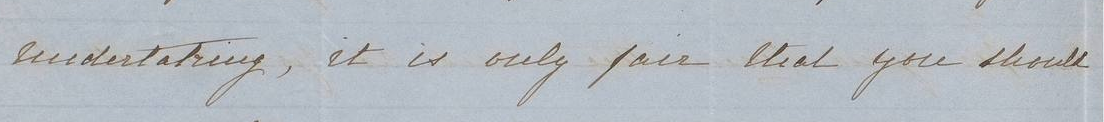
undertaking, it is only fair that you would
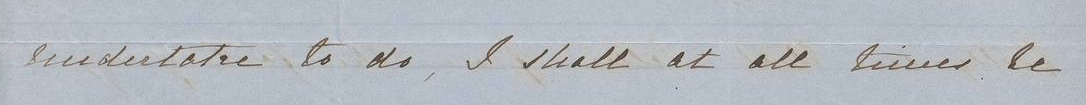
undertake to do, I shall at all times be
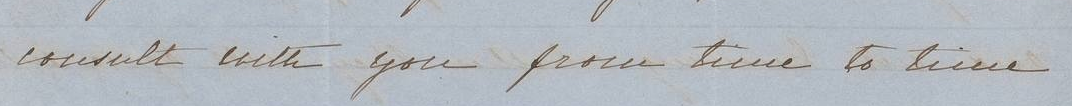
consult with you from time to time
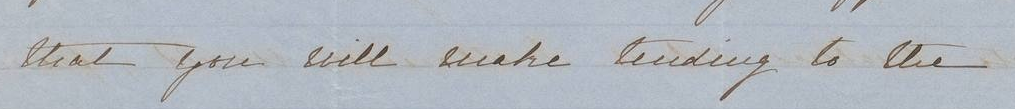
that you will make tending to the
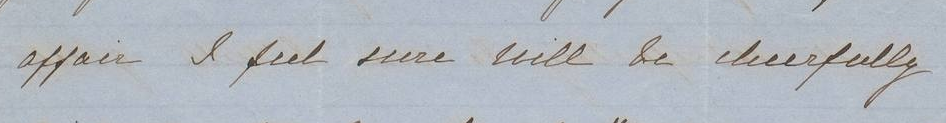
affair I feel sure will be cheerfully
